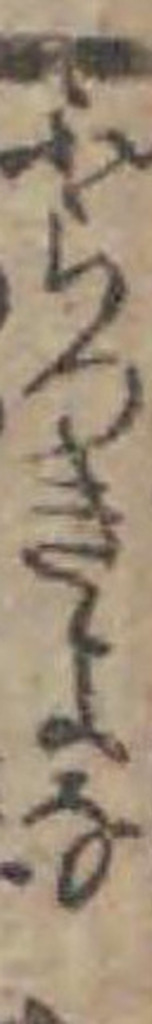ふらつきよな
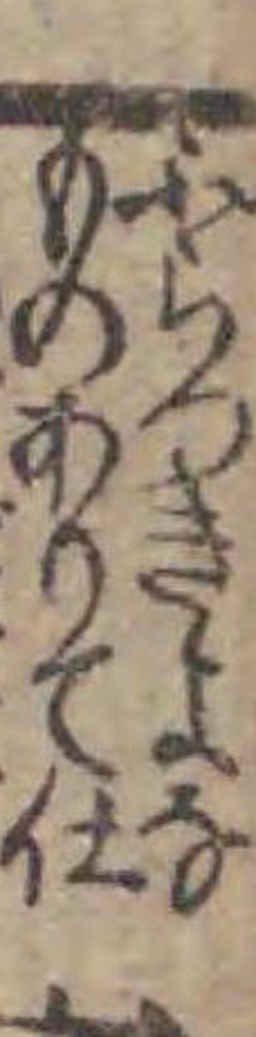ものありて仕
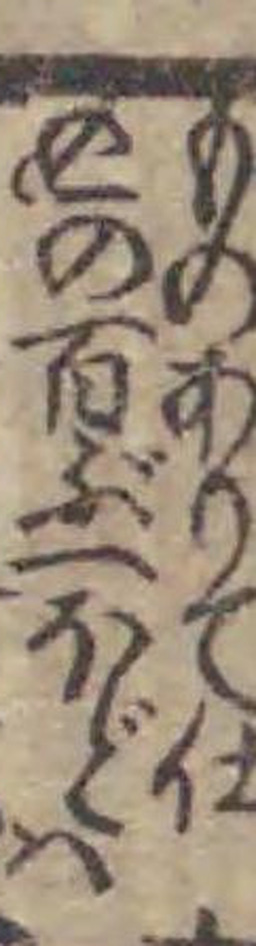込の百ぶ一ほどは
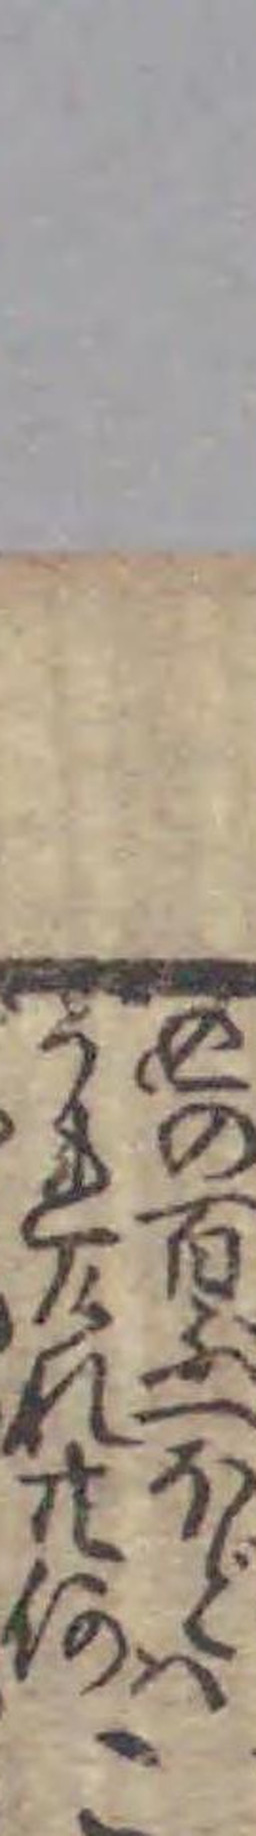うれけれ共何
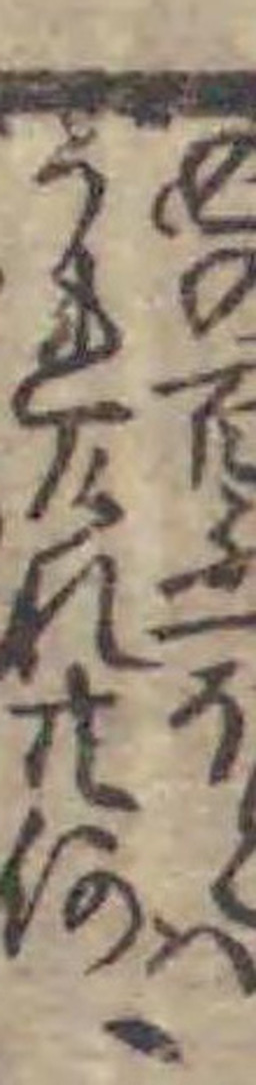うれけれ共何
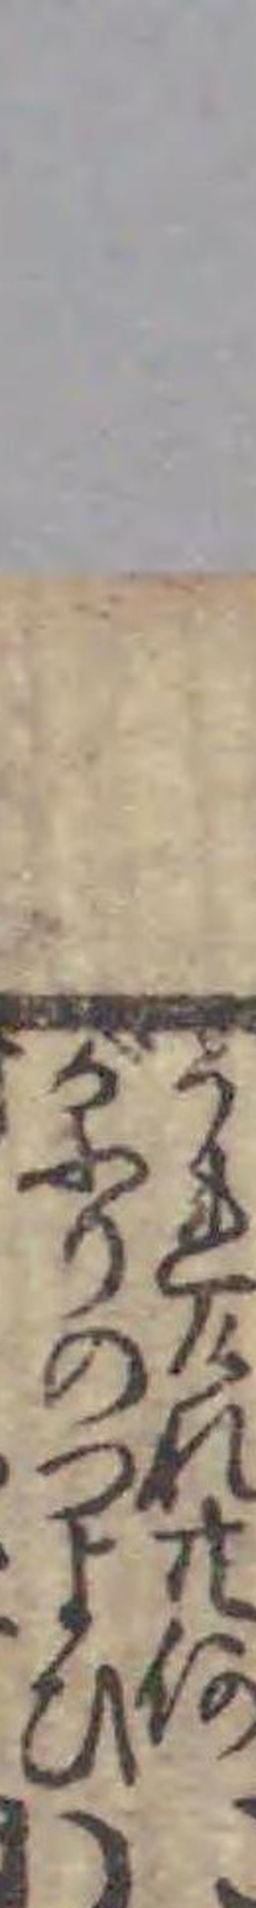がふりのつよひ
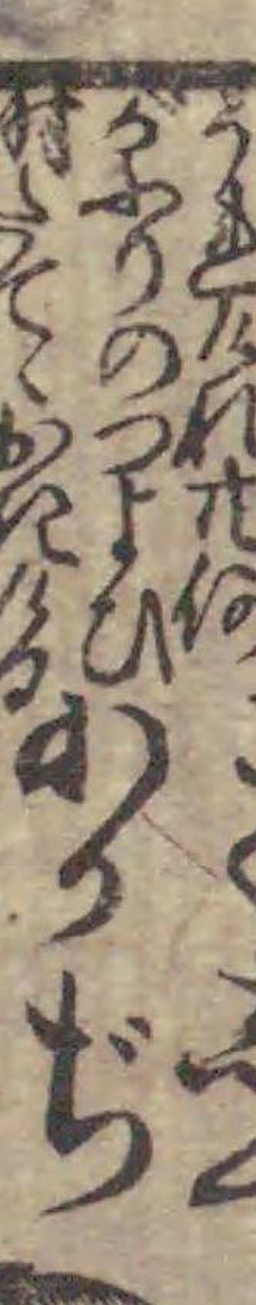時たてゝおきける
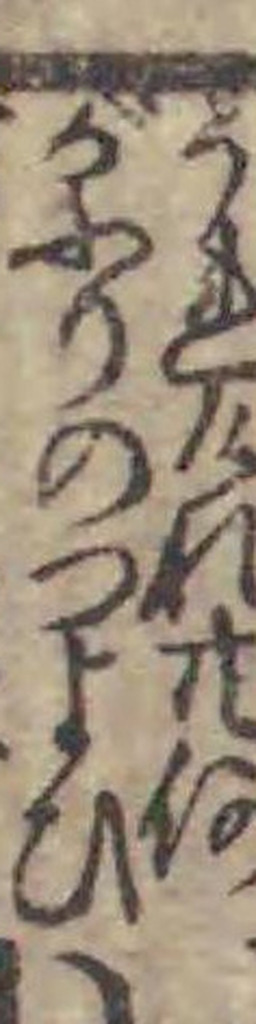がふりのつよひ
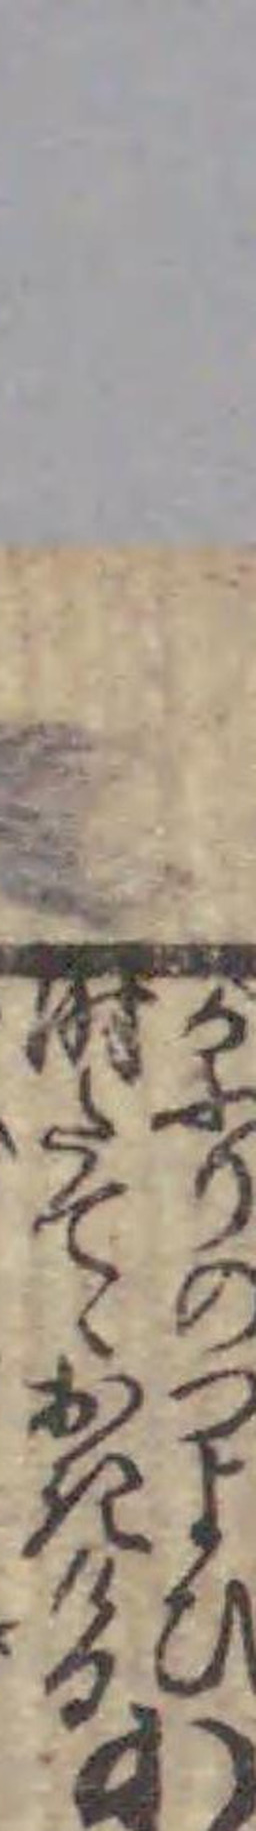時たてゝおきける
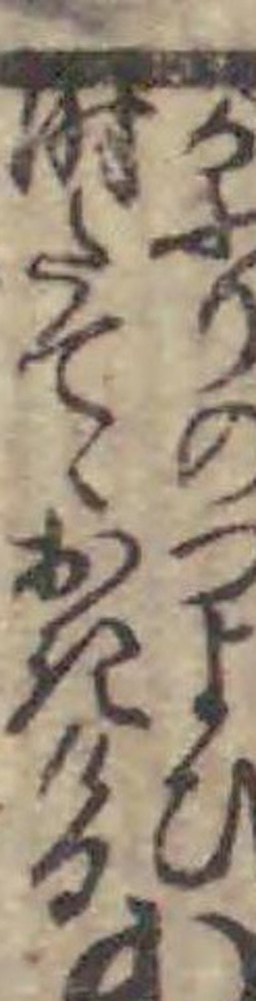時たてゝおきける
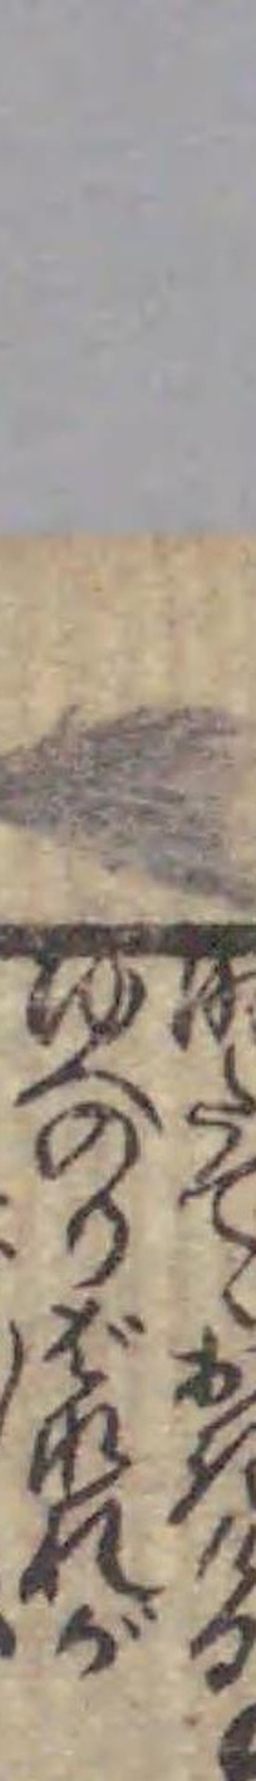ゆへのりばなれが
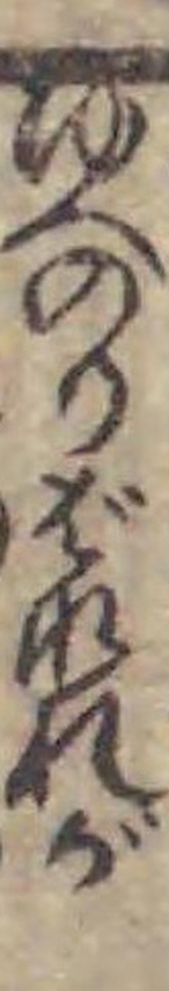ゆへのりばなれが
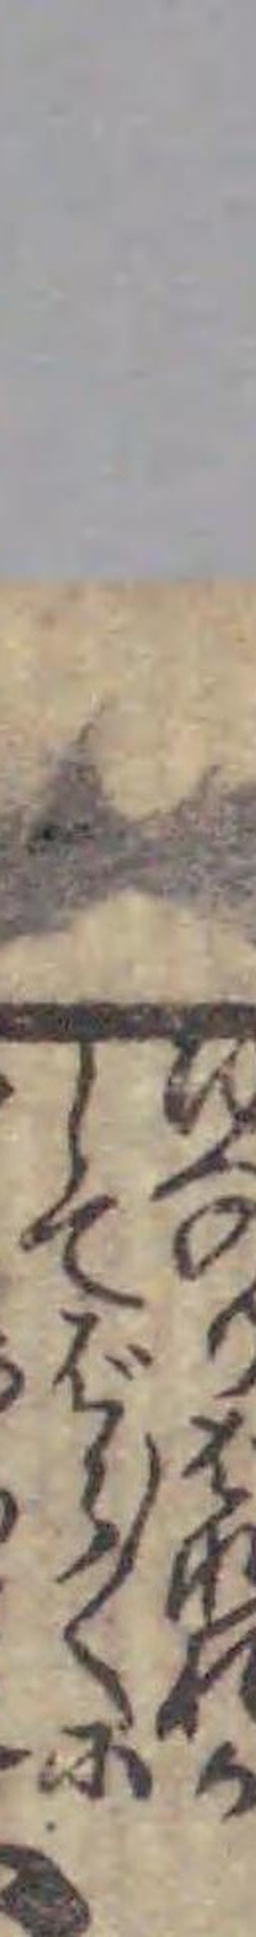してばら〳〵に
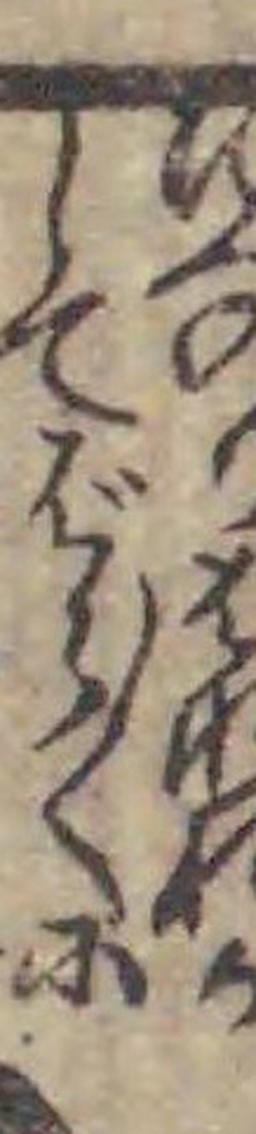してばら〳〵に
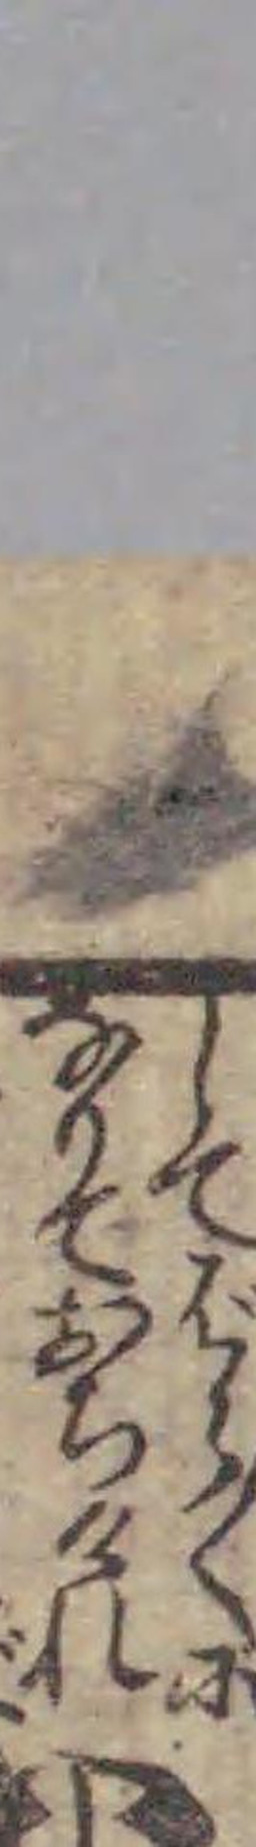なりておちければ
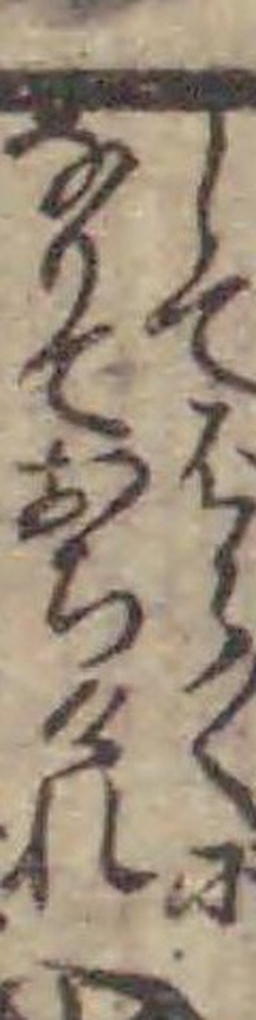なりておちければ
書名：本樹真猿浮気噺 : 3巻
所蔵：国立国会図書館 National Diet Library, JAPAN
